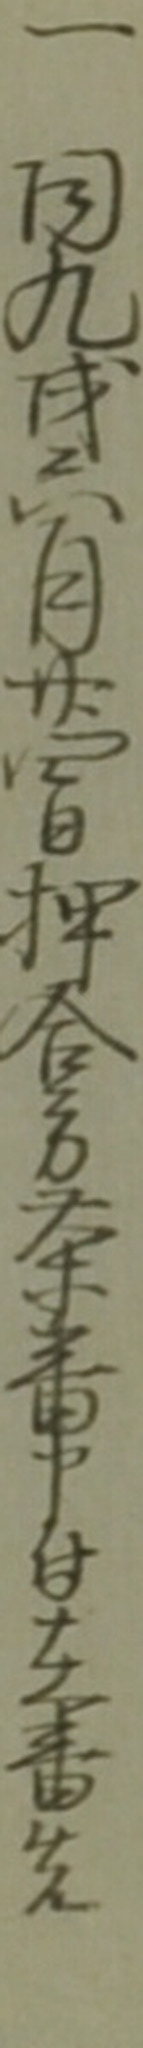一同九戌六月廿四日押合方茶番申付在番先
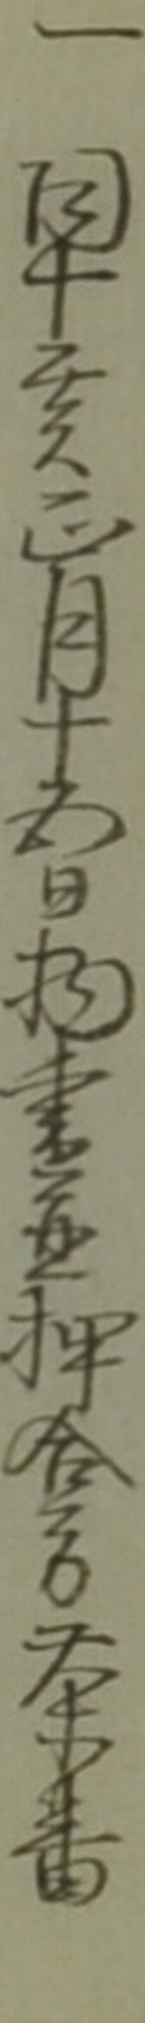一同十亥正月十五日物書並押合方茶番
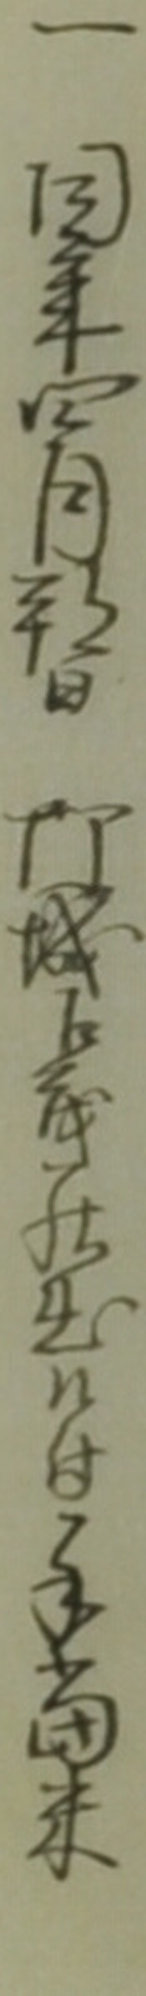一同年四月朔日御城江茂罷出候付手当米
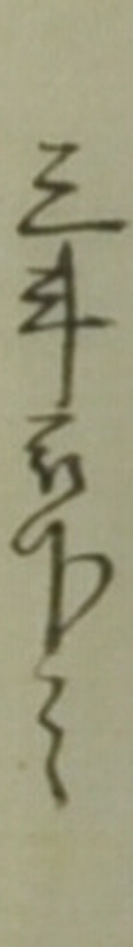三斗被下之
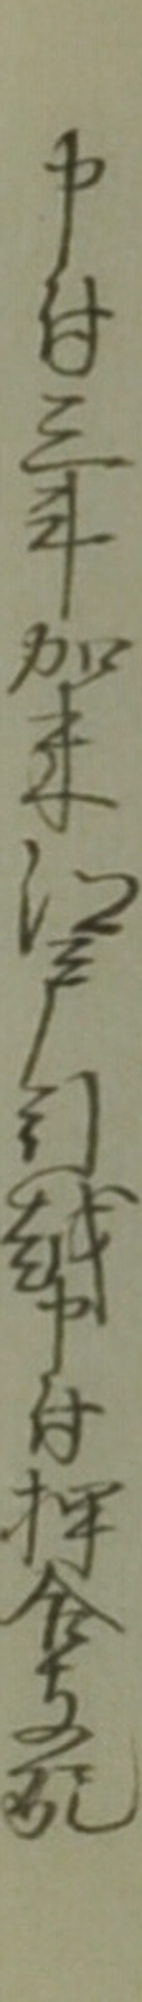申付三斗加米江戸引越申付押合支配

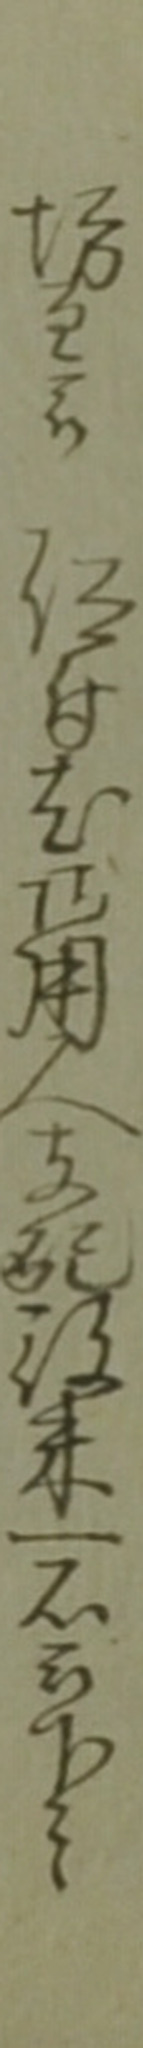坊主被仰付尤御用人支配役米一石被下之
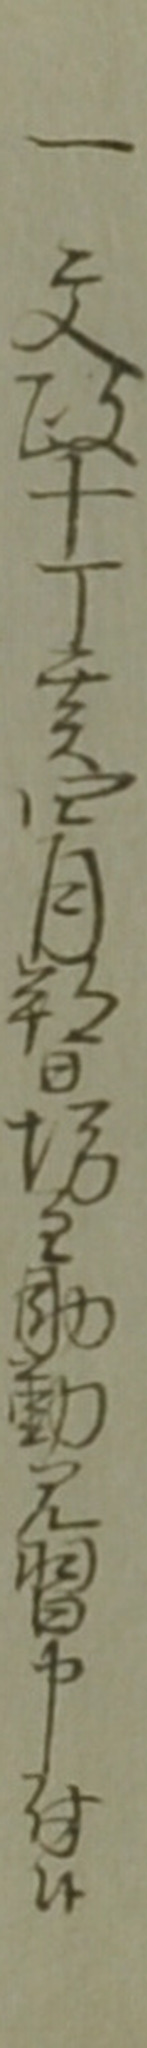一文政十丁亥四月朔日坊主助勤見習申付候
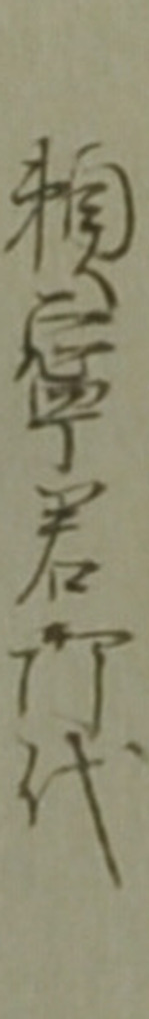頼寧君御代
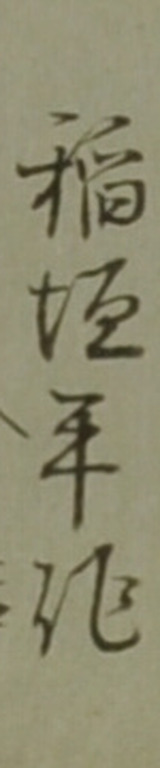稲垣平作
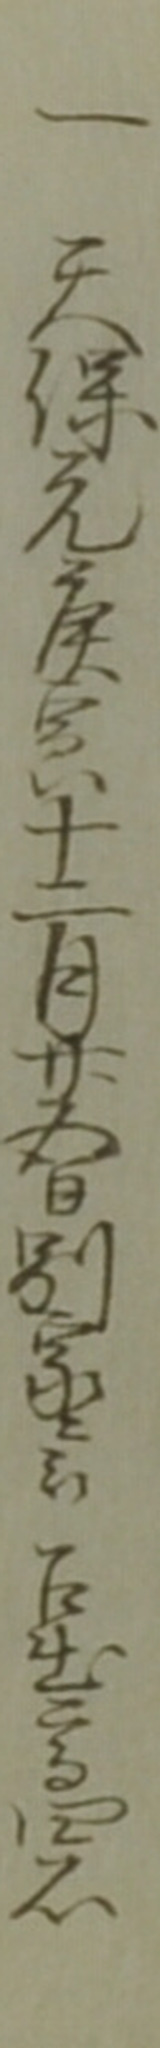一天保元庚寅十二月廿五日別家被召出俵四石
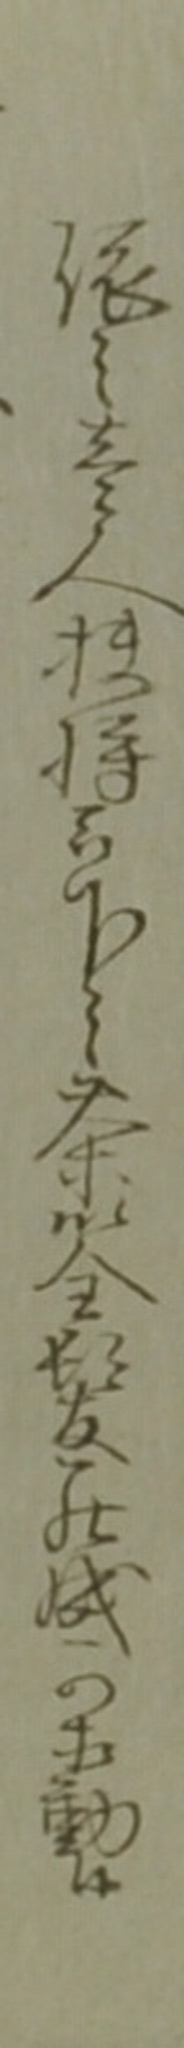依之壱人扶持被下之茶筌髪罷越可相勤候
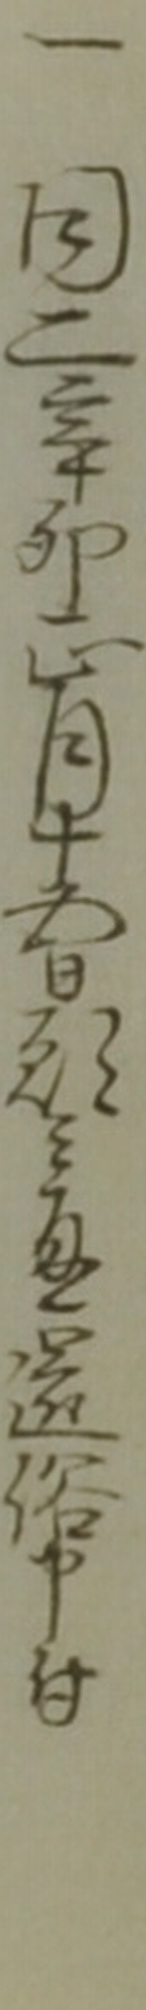一同二辛卯正月十五日願之通還俗申付
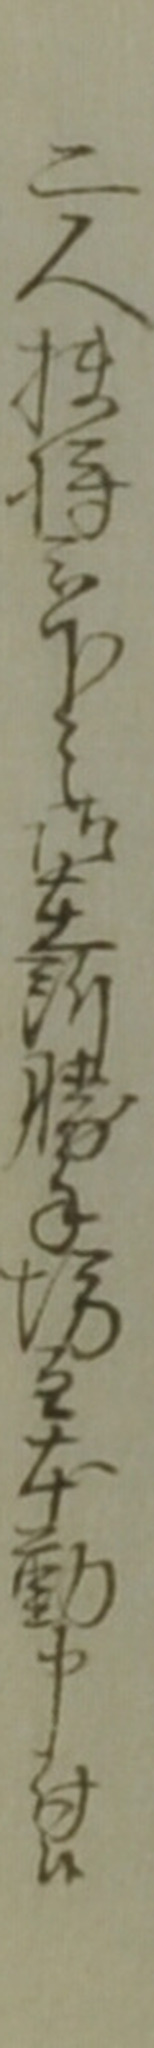二人扶持被下之御在所勝手坊主本勤申付候
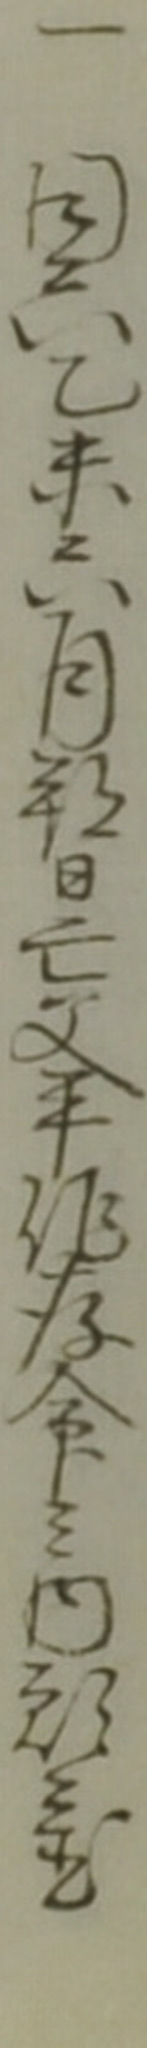一同六乙未六月朔日亡父平作存命之内願置
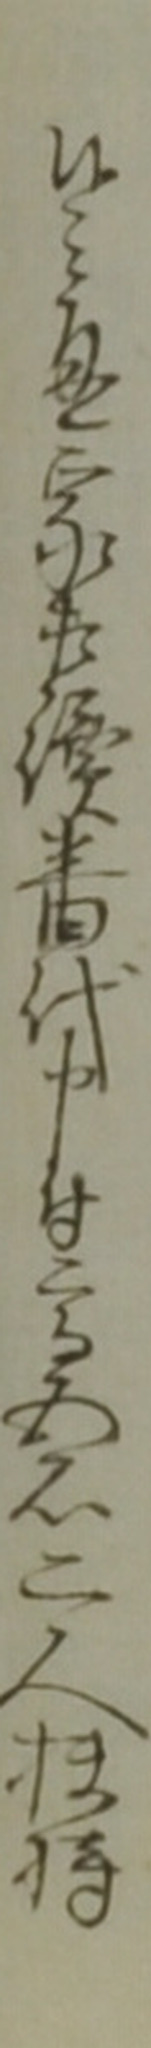候之通家相続番代申付高五石二人扶持
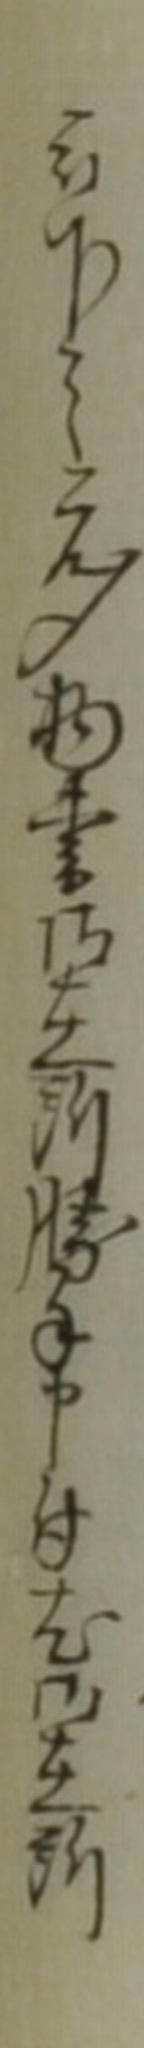被下之元〆物書御在所勝手申付尤御在所
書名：無足諸士勤仕録（八）
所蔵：伊那市立高遠町図書館・合同会社AMANE
